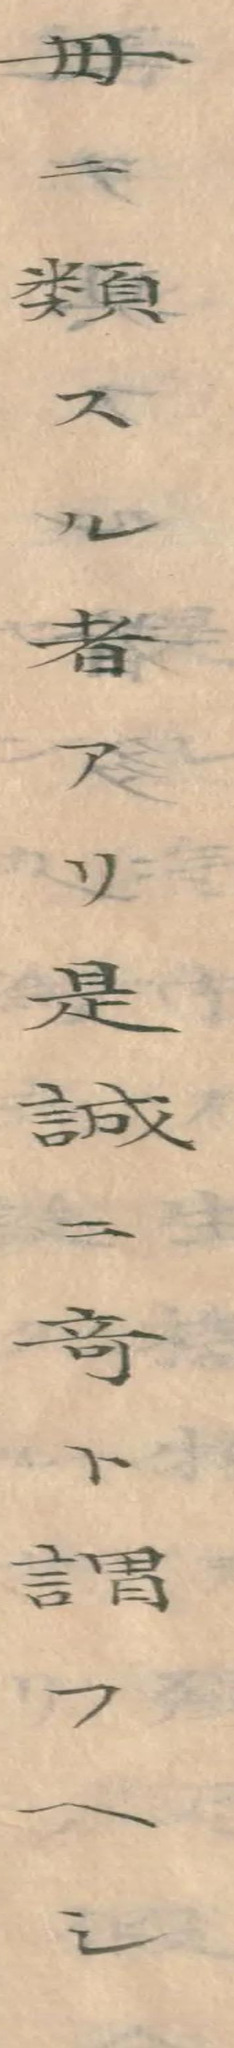母ニ類スル者アリ是誠ニ奇ト謂フヘシ
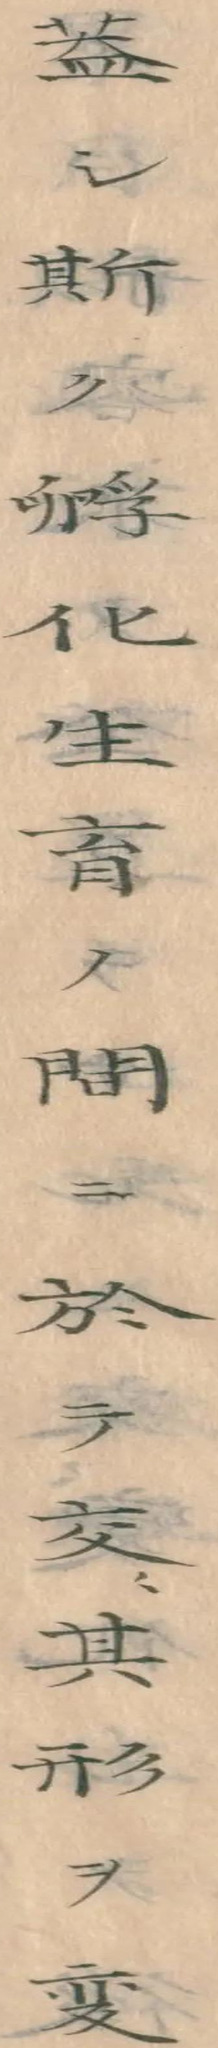蓋シ斯ク孵化生育ノ間ニ於テ交々其形ヲ変
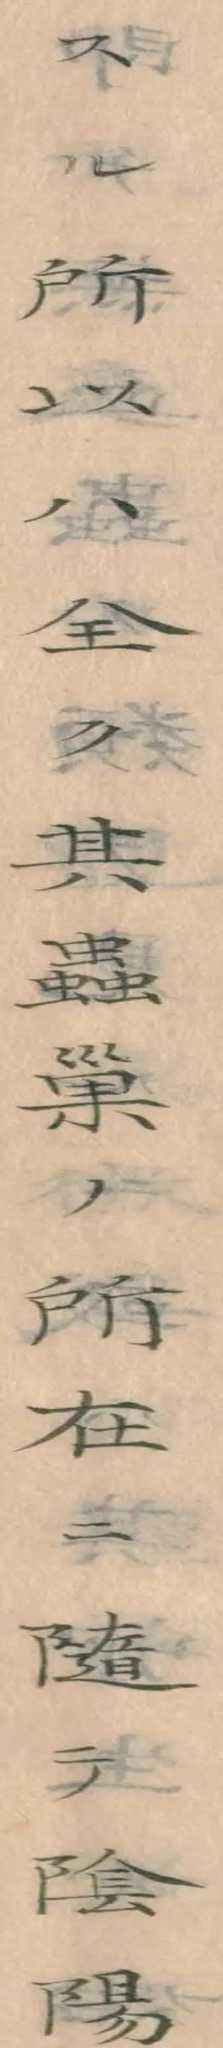スル所以ハ全ク其虫巣ノ所在ニ随テ陰陽
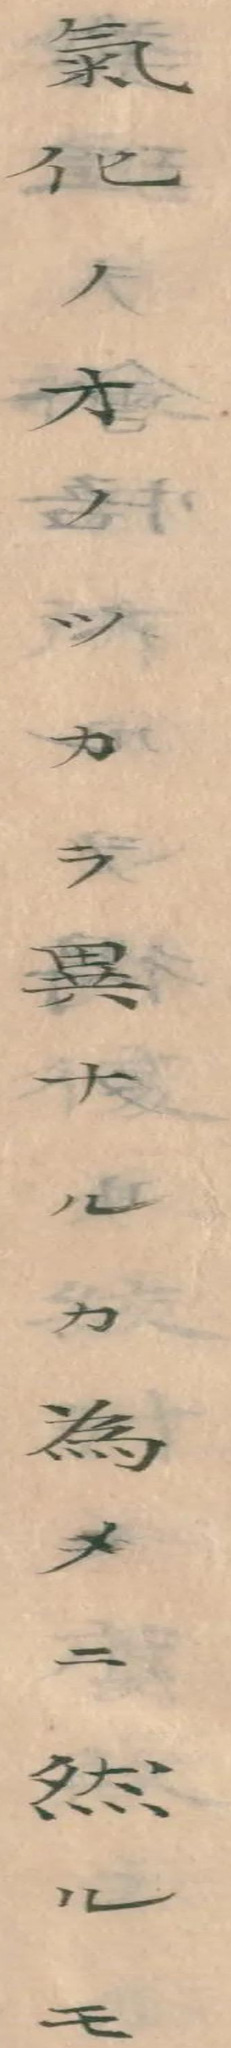気化ノオノツカラ異ナルカ為メニ然ルモ
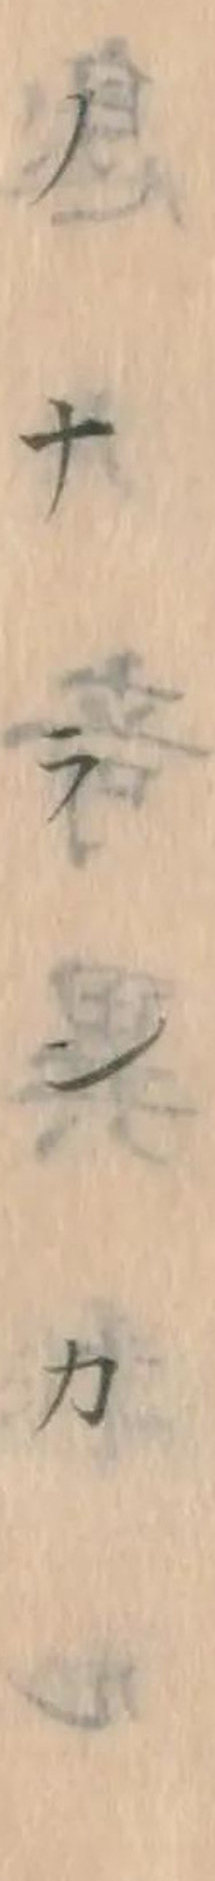ノナランカ
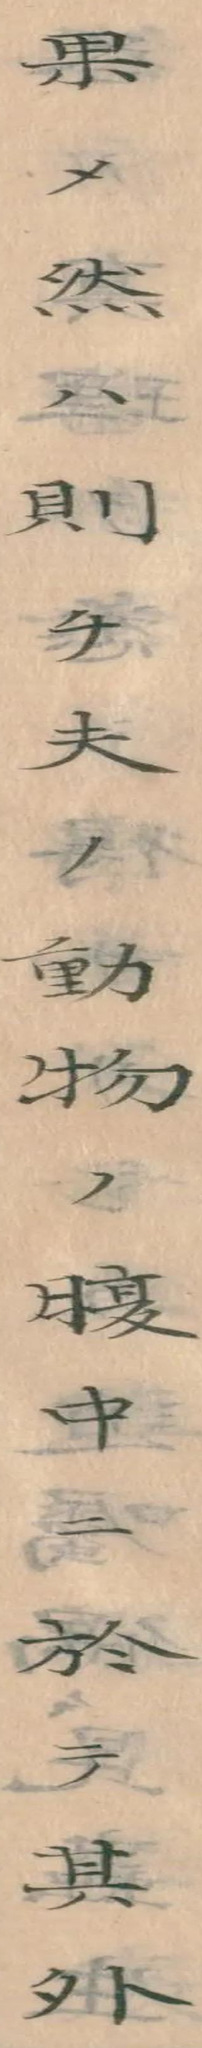果シテ然ハ則チ夫ノ動物ノ腹中ニ於テ其外
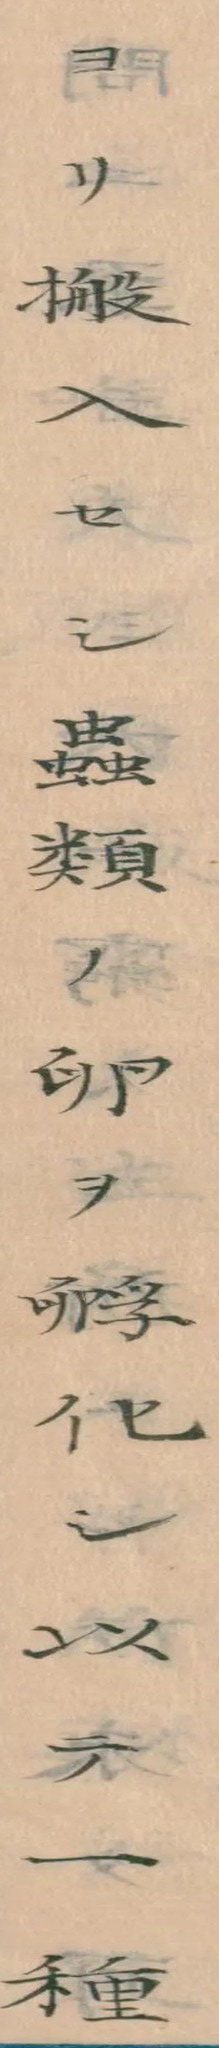ヨリ搬入セシ虫類ノ卵ヲ孵化シ以テ一種
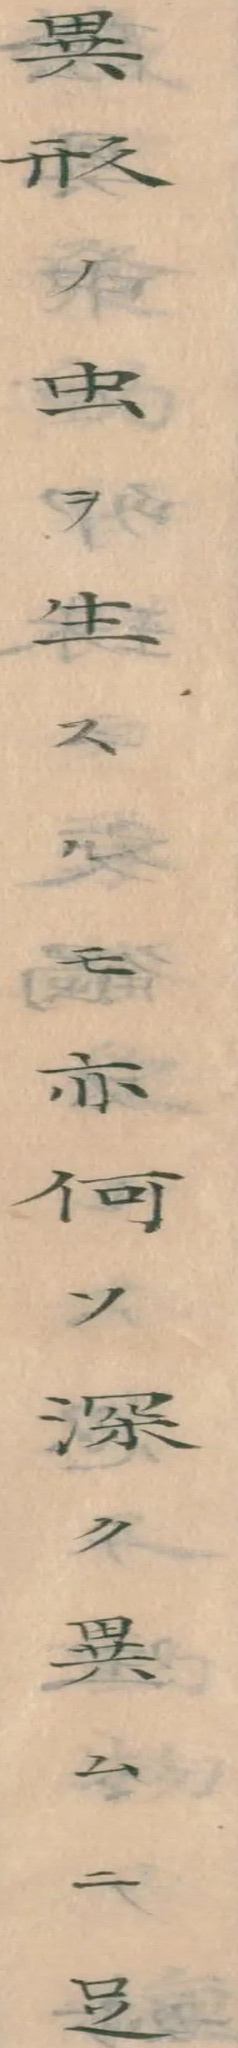異形ノ虫ヲ生スルモ亦何ソ深ク異ムニ足
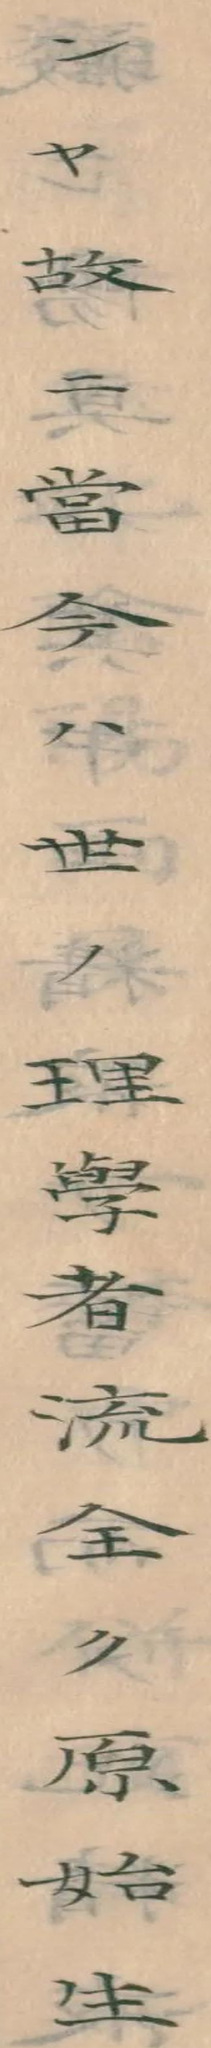ンヤ故ニ当今ハ世ノ理学者流全ク原始生
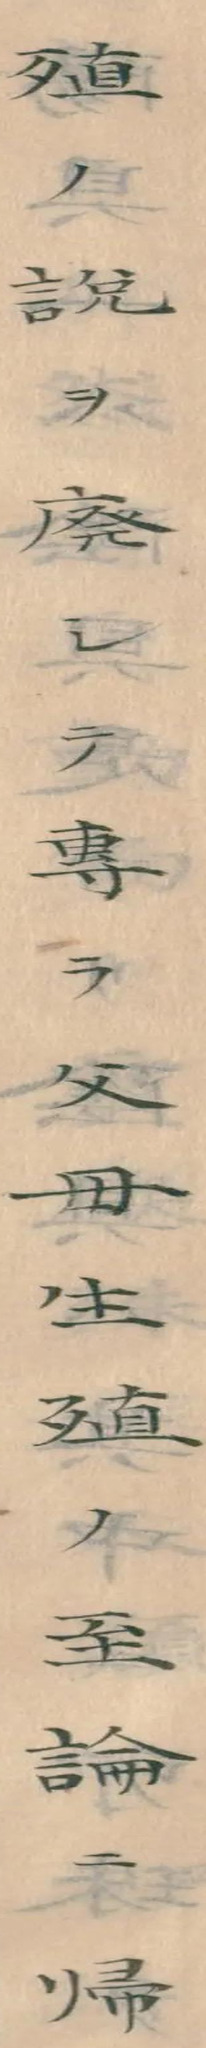殖ノ説ヲ廃シテ専ラ父母生殖ノ至論ニ帰
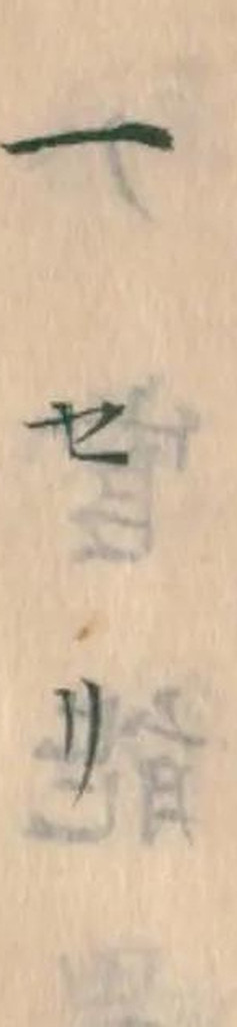一セリ
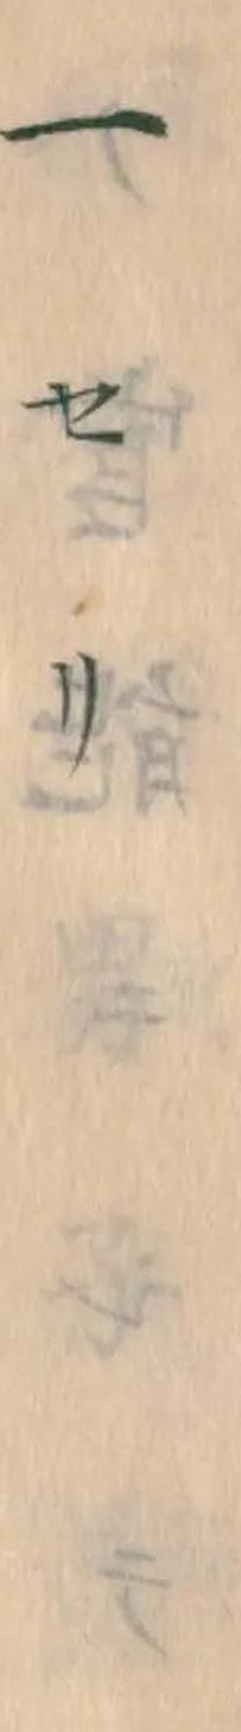一セリ
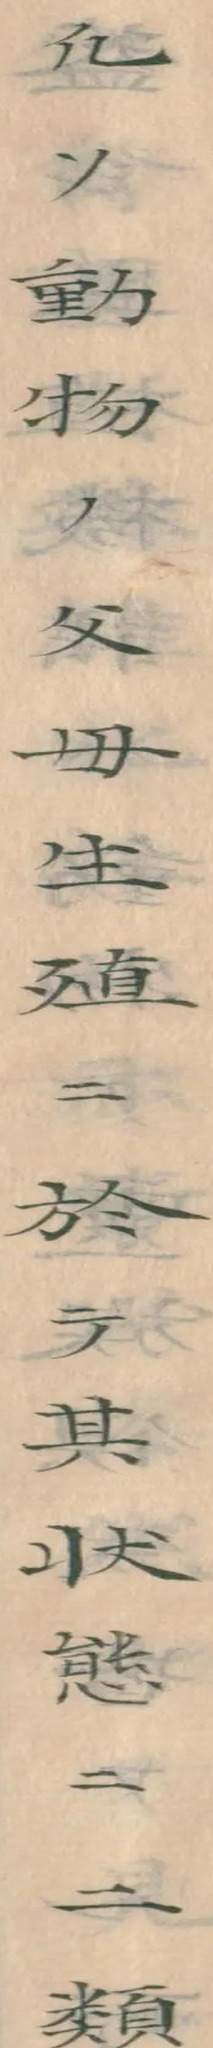凡ソ動物ノ父母生殖ニ於テ其状態ニ二類
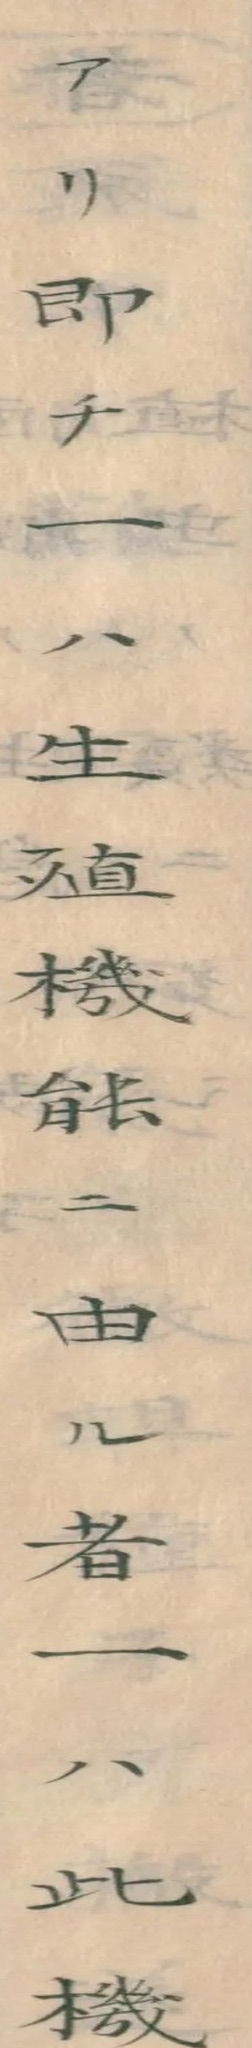アリ即チ一ハ生殖機能ニ由ル者一ハ此機
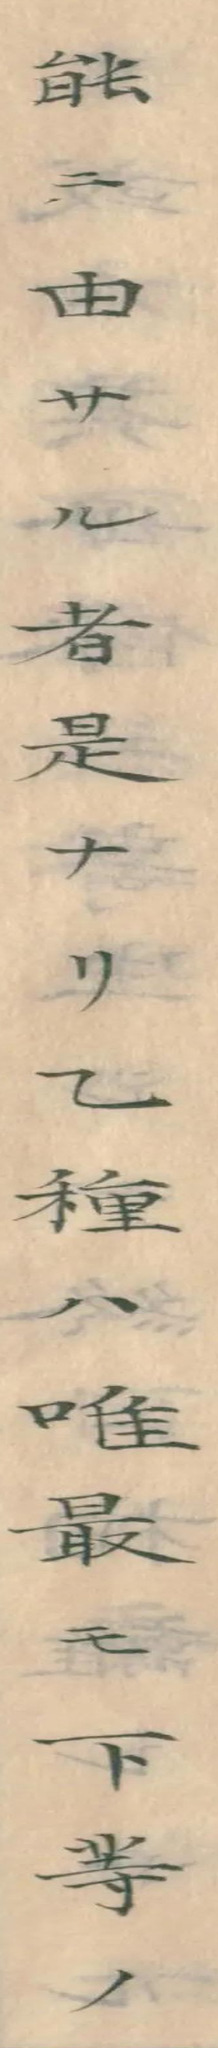能ニ由サル者是ナリ乙種ハ唯最モ下等ノ
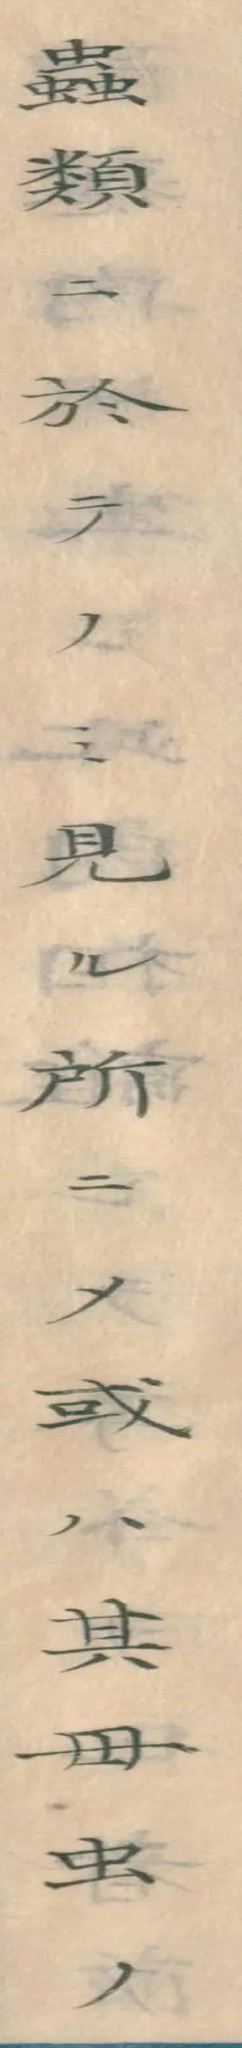虫類ニ於テノミ見ル所ニシテ或ハ其母虫ノ
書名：蚕桑集成
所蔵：国立国会図書館 National Diet Library, JAPAN
